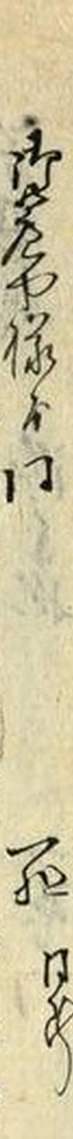御簾中様ゟ同一組同断
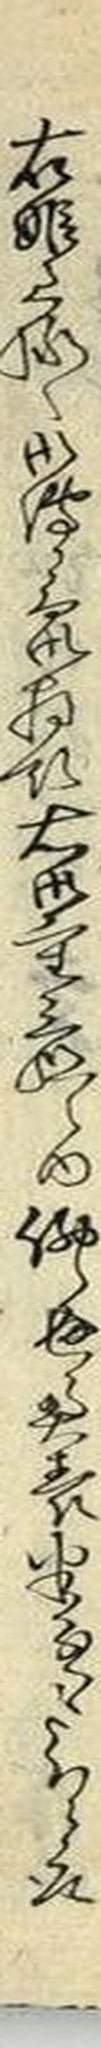右姫君様之御伝ニ而御拝領右御重三組之内例之通奥表半分ツゝ被下之取
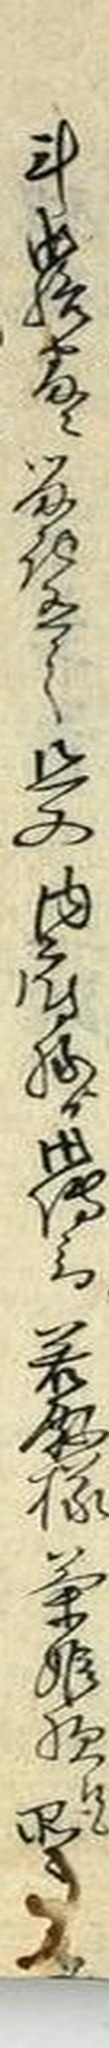斗御膳番ニ留記有之且又内府様ゟ御伝ニ而若殿様菊姫様江も品々
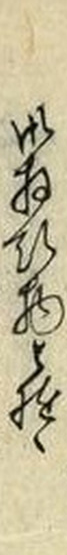御拝領物被遊候
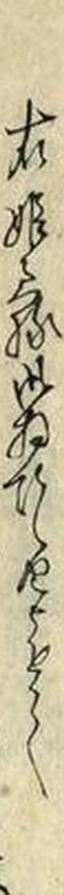右姫君様御拝領候由被進之
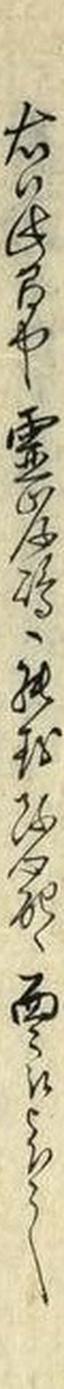右ハ此間中霊岸嶋へ罷越致心配候面々江被下之
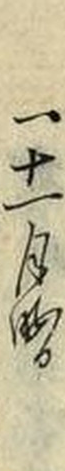一十一月晦日
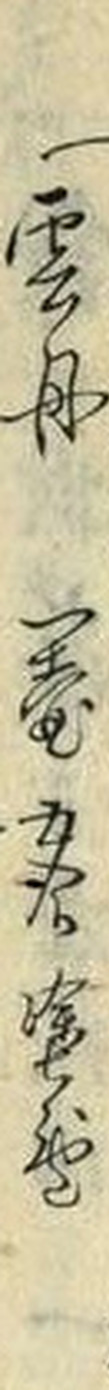雲丹一壺五合塗台
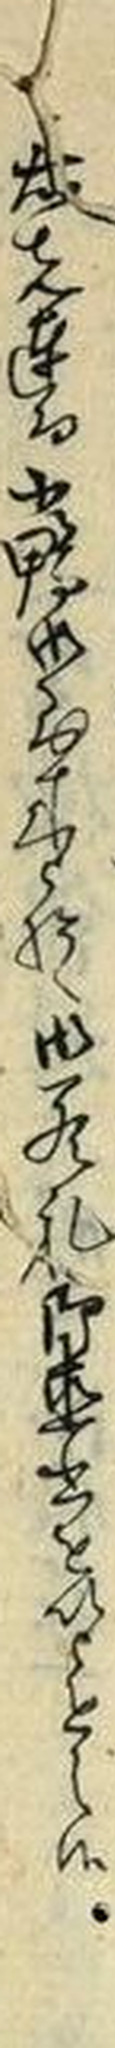右先達而小鴨御到来被遊候御答礼御直書を以被進之候
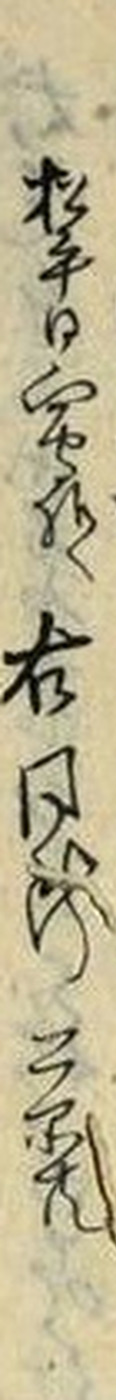松平日向守様へ右同断二品共

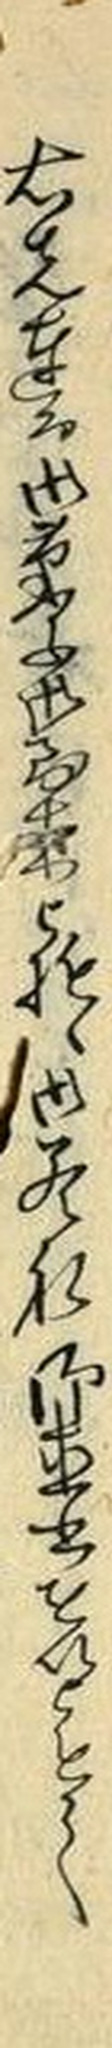右先達而御菓子御到来被遊候御答礼御直書を以被進之
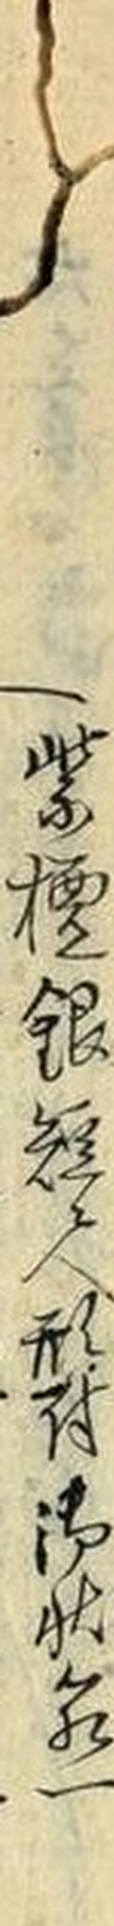紫檀銀短尺形付御状箱一
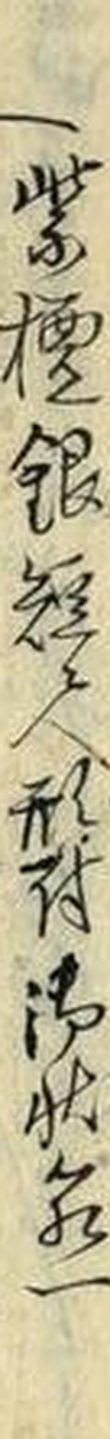紫檀銀短尺形付御状箱一
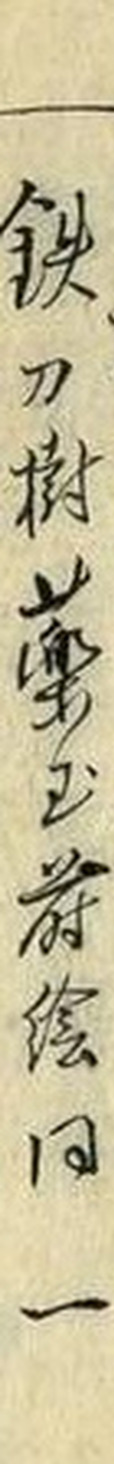鉄刀樹薬玉蒔絵同一
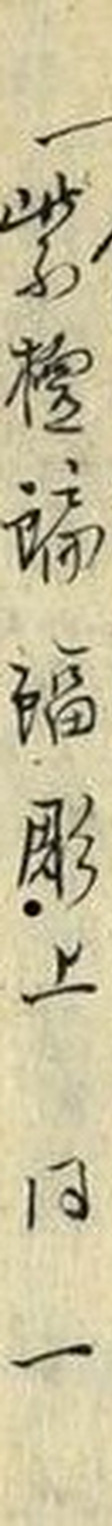紫檀蝙蝠彫上同一
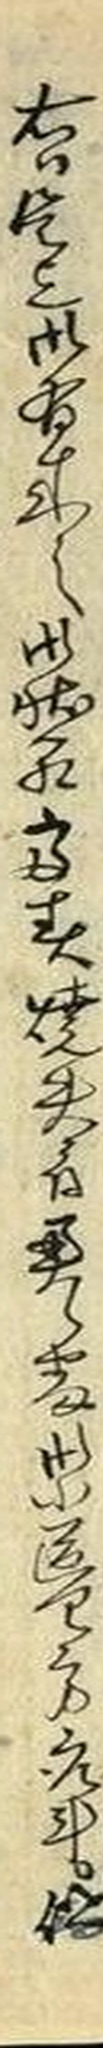右是迄御有来之御状箱当春焼失ニ付奥之番御小道具方取斗出来但
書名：少傅日録抄（斉承付側向頭取日記、在府）
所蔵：福井県文書館 Fukui Prefectural Archives
